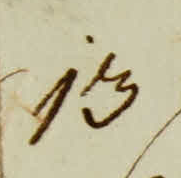13
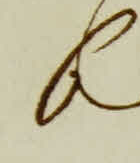6
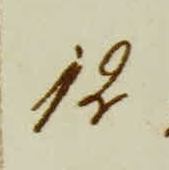12
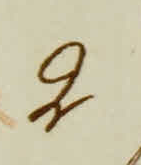2
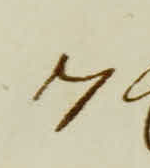7
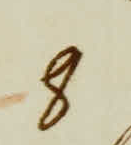8
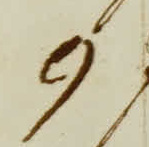9
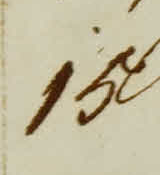15
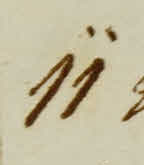11
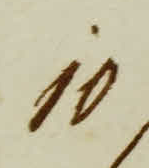10
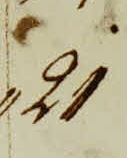21
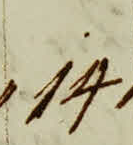14
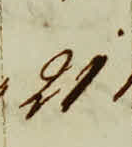21
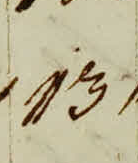13
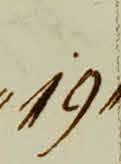19
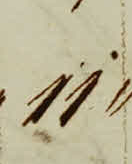11
